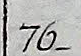76
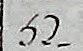52
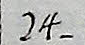24
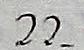22
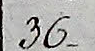36
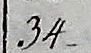34
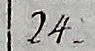24
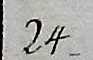24
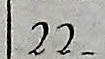22
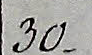30
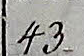43
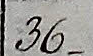36
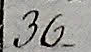36
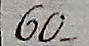60
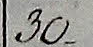30
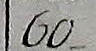60
